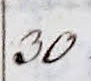30
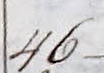46
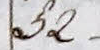52
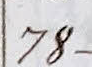78
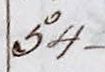54
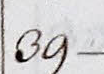39
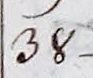38
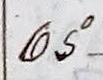65
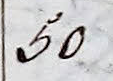50
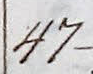47
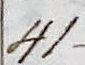41
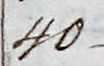40
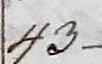43
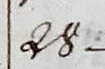28
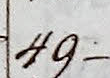49
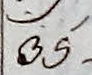35
